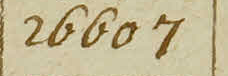26607
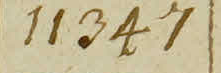11347
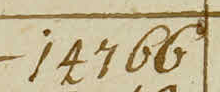14766
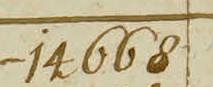14668
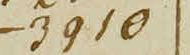3910
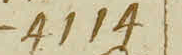4114
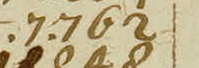7762
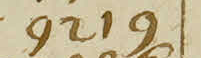9219
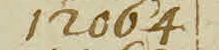12064
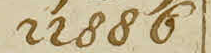22886
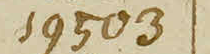19503
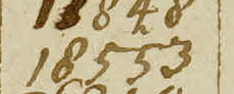18553
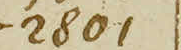2801
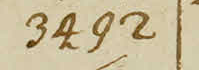3492
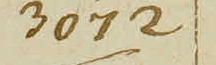3072
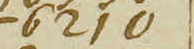6210
